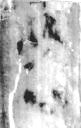梄（酉）
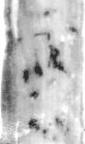少
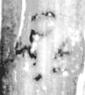翏（瘳）
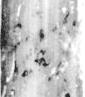戌
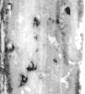大
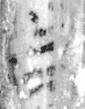翏（瘳）
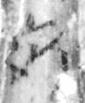死
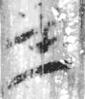生
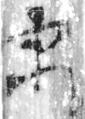才（在）
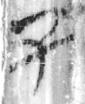子
